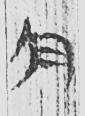今
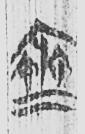齊
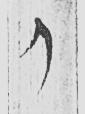人
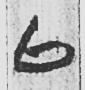㠯（以）
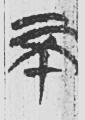不
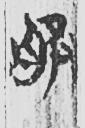服
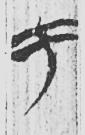于
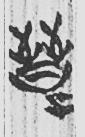晉=
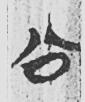公
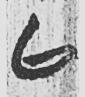㠯（以）
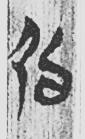{人勺}
